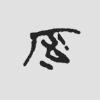{厂水}
